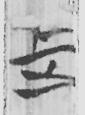上B（上）
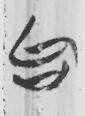句
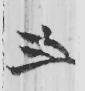之
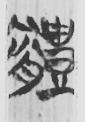體
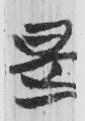是
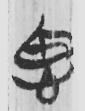思
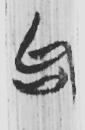句
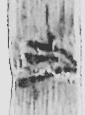之
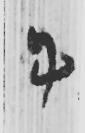身
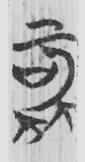{可䖵}
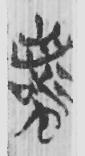{若虫}
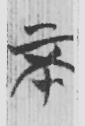不
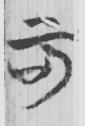可
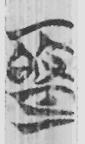{亟止}
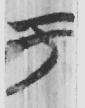于
